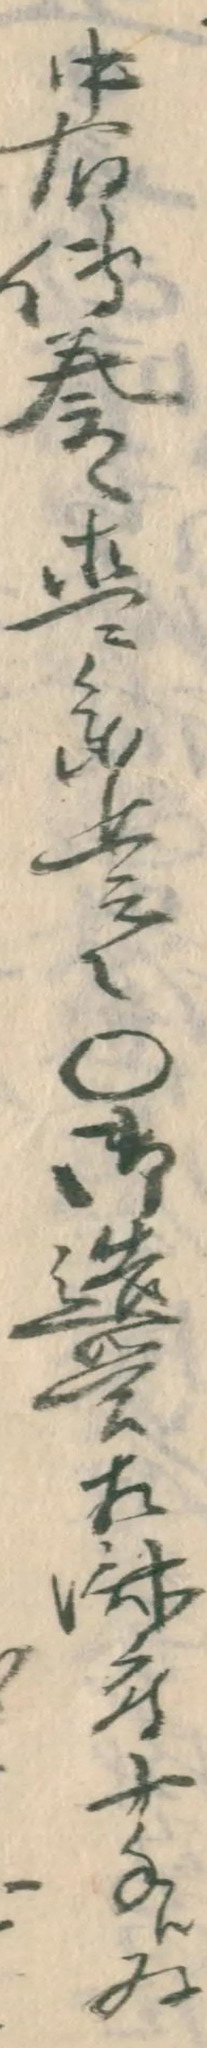中宿傳奏へ直ニ参上云々○御造営相済ニ付十手え為
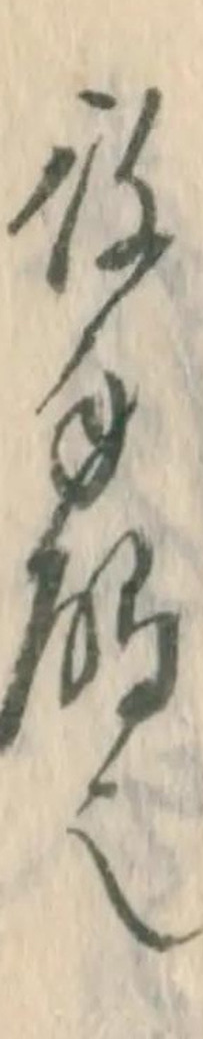役手觸也
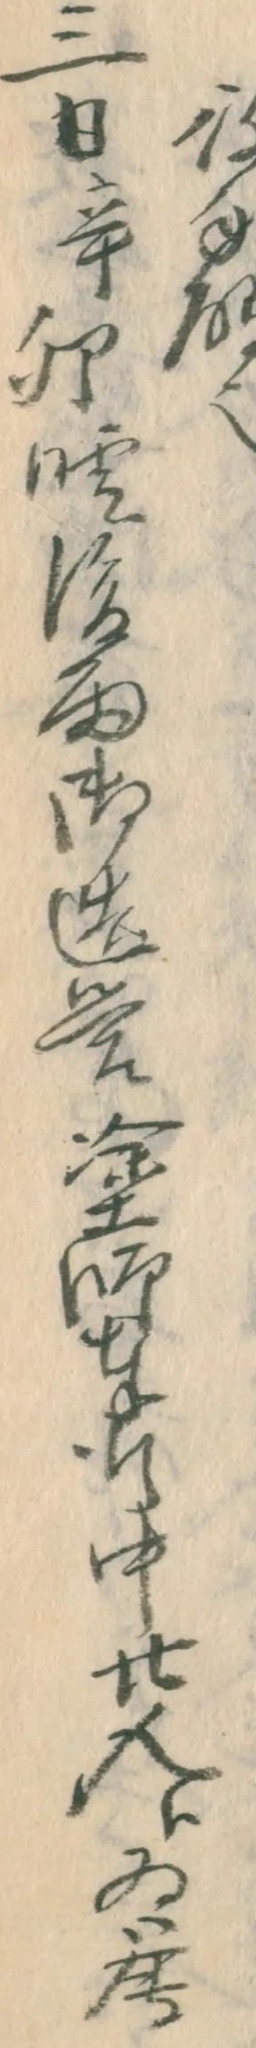三日辛卯曇後雨御造営塗師奉行中廿人え為御會

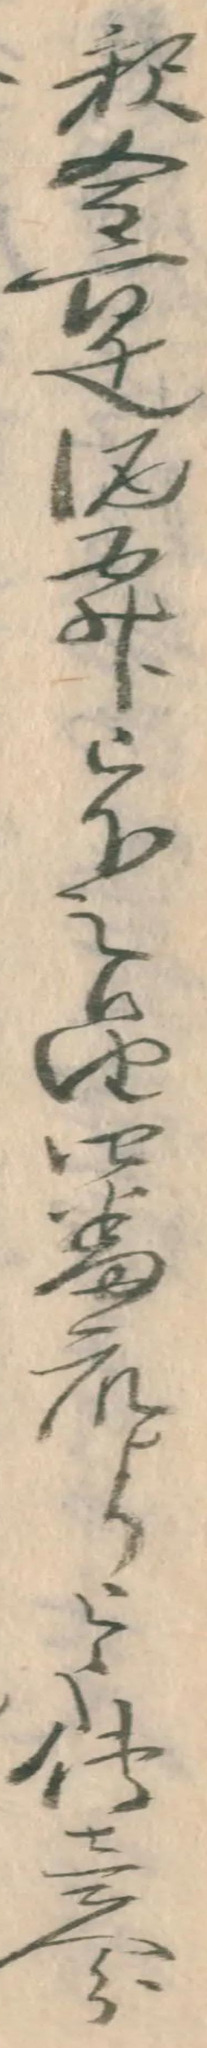頼金百疋酒五升被下之候由四番衆より被申傳壱人分
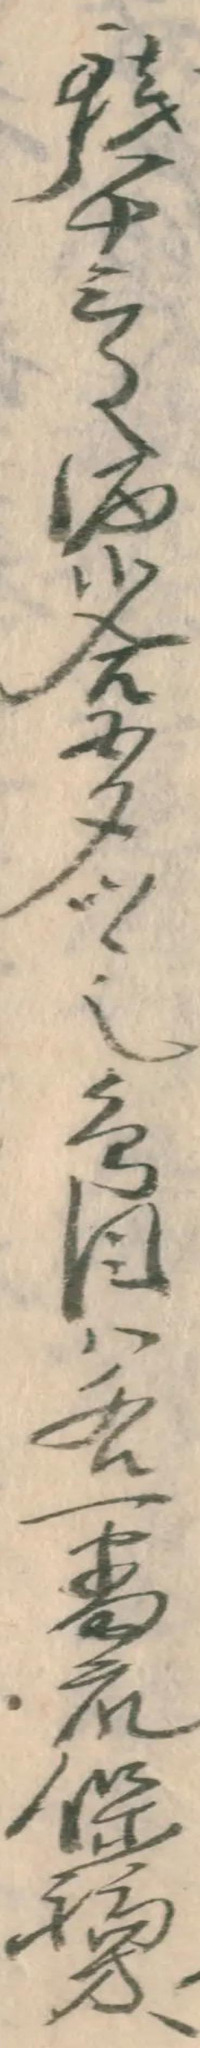銭八十三匁酒弐合五勺ツヽ也鳥目ハ各一番衆保福方へ
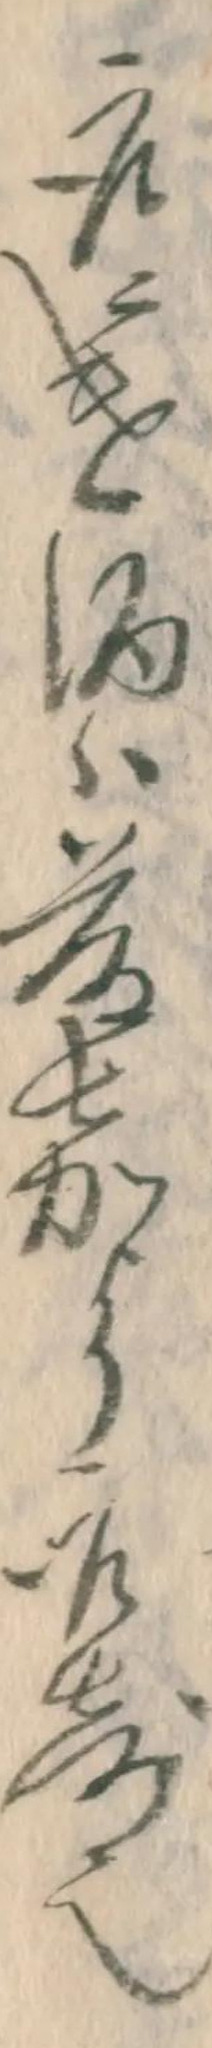取に遣酒は藤七加より取寄也
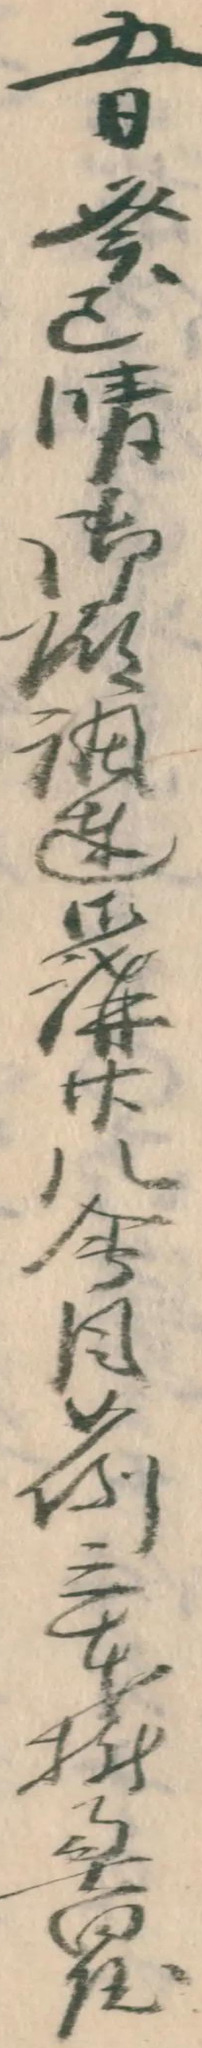五日癸巳晴御殿調達御講廿八會目如例三本樹奥田屋
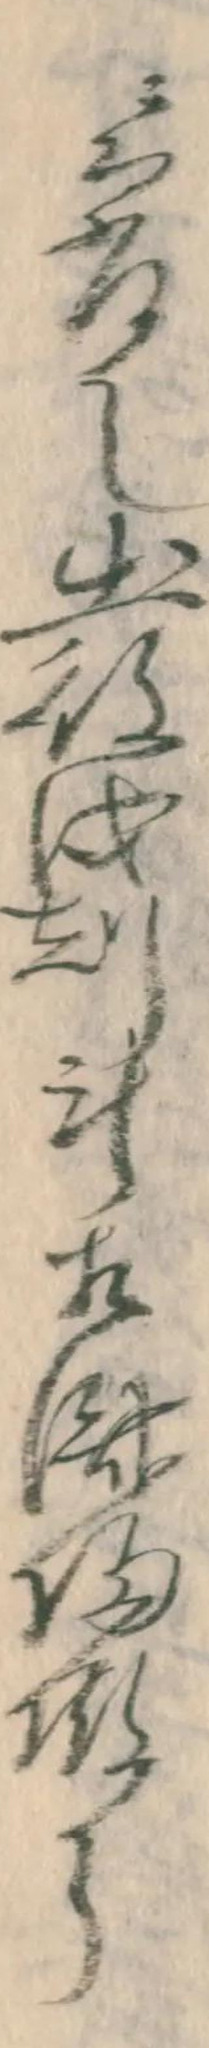ニ而有之出役戌刻斗相済帰殿了
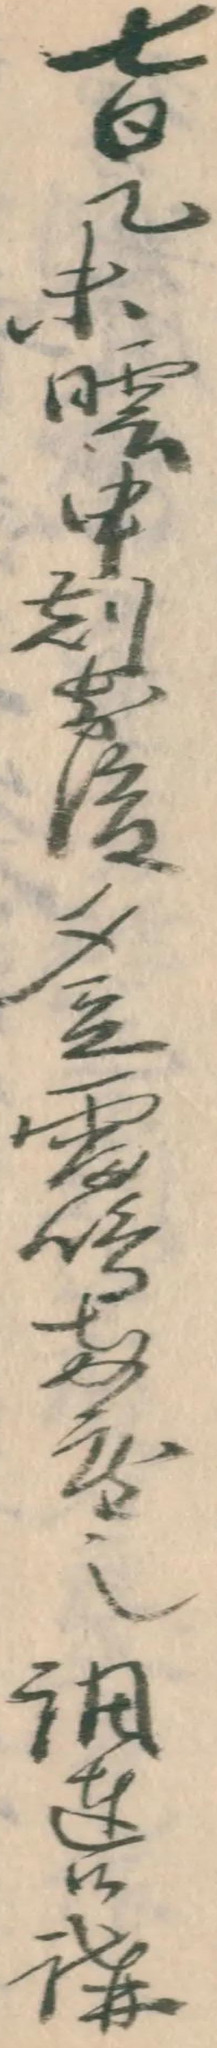七日乙未曇申刻於後夕立雷鳴両度也調達御講
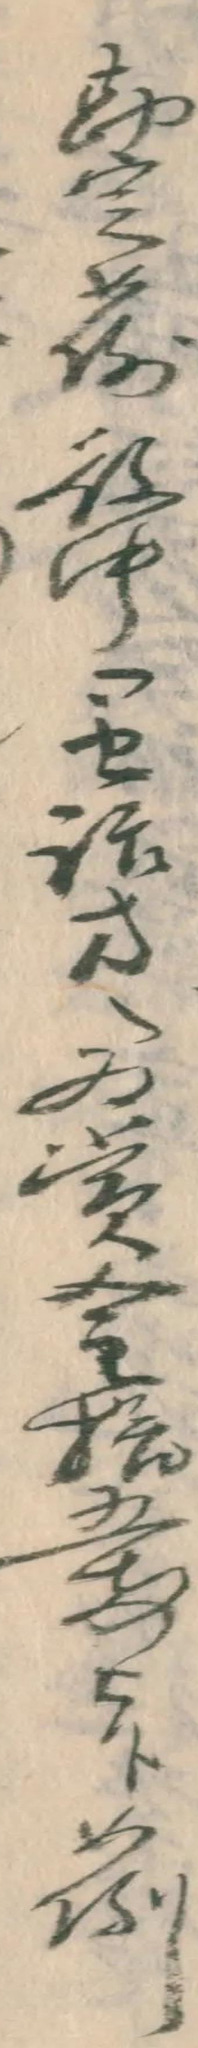勘定如例役中御世話方へ為賞金拾五両被下如例
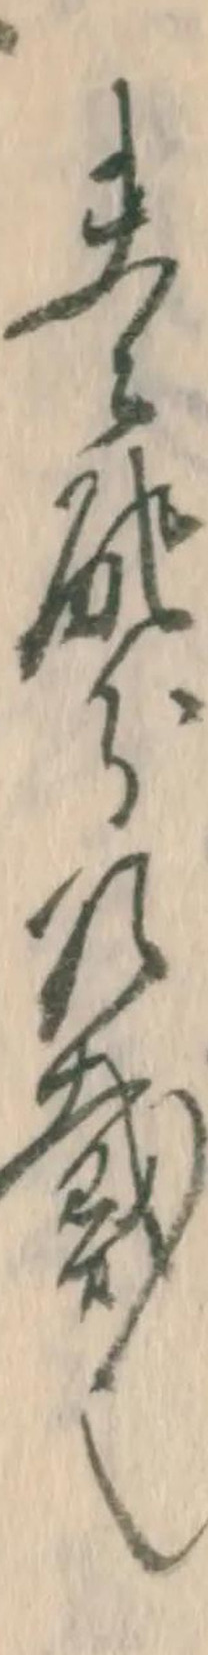夫〻配分頂戴也
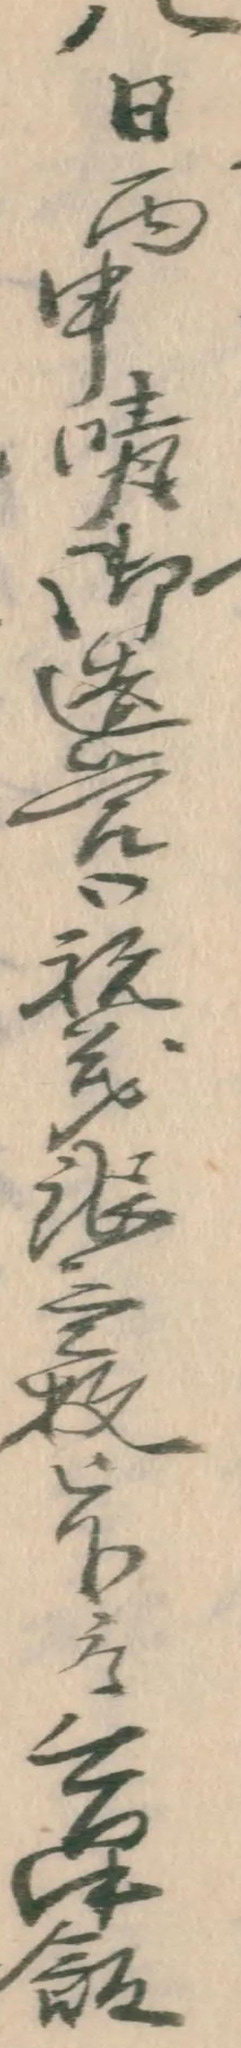八日丙申晴御造営御祝義銀壱枚被下ニ付今日中飯
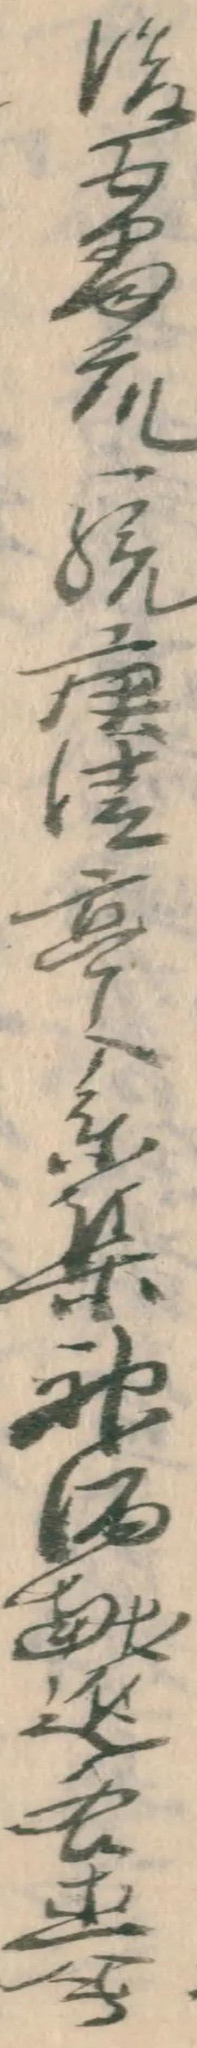後五番衆一統庚清亭へ参集神酒献進各直会
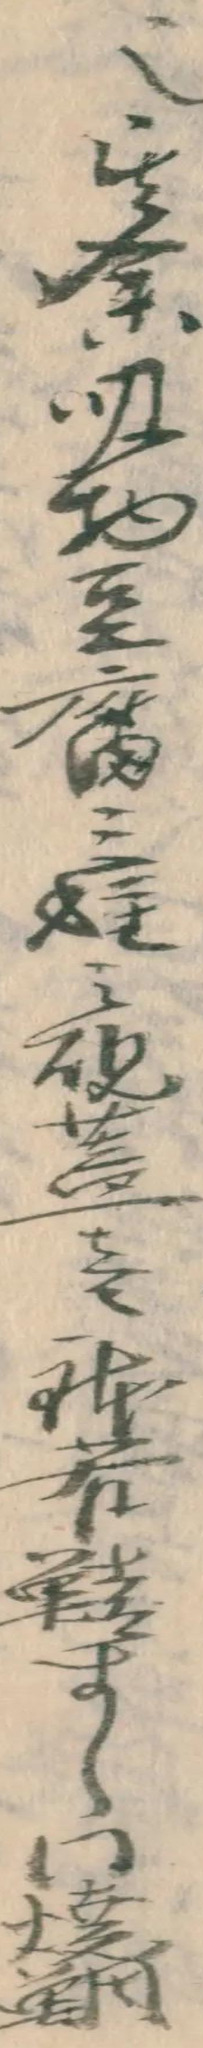也其余吸物豆腐三種之硯蓋壱鉢肴鰭すし同焼鯛
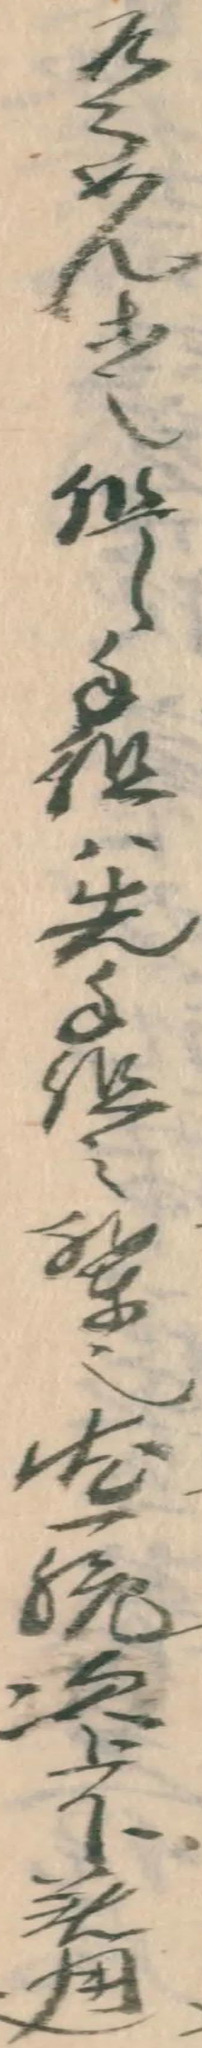そうめん等之但し手組ハ先手組之輩也尤一統次上下着用也
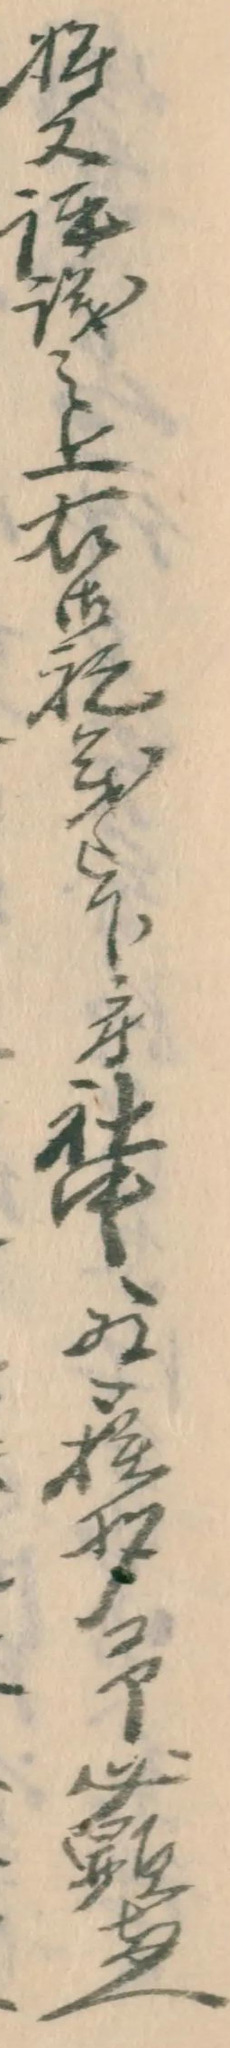将又評議之上右御祝義被下ニ付社中へ為御挨拶予必顕両人
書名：賀茂社記録. 第67冊
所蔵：国立国会図書館 National Diet Library, JAPAN
